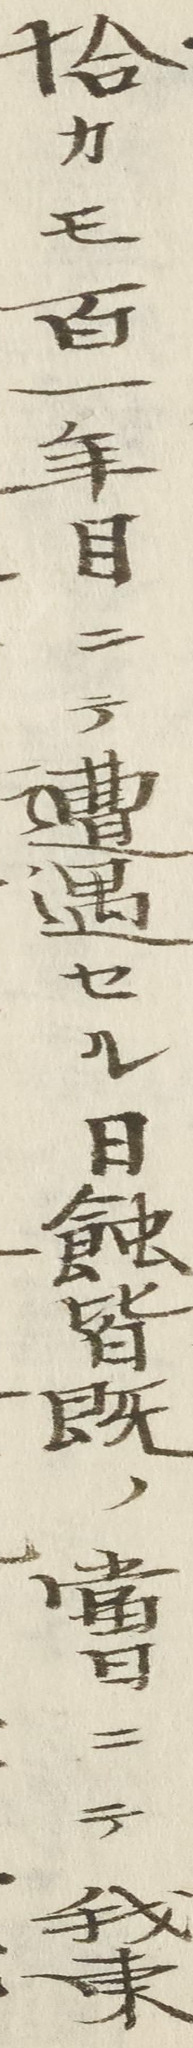恰カモ百一年目ニテ遭遇セル日蝕皆既ノ当日ニテ我東
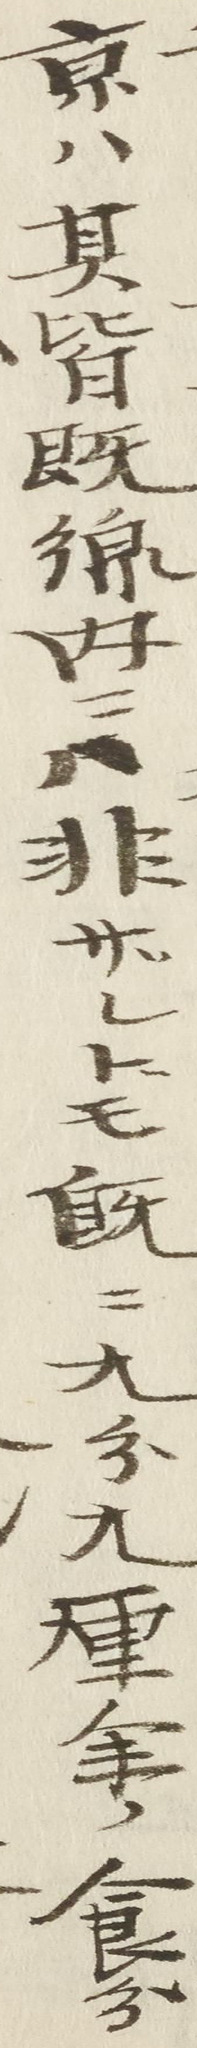京ハ其皆既線内ニハ非ザレドモ既ニ九分九厘余ノ食分
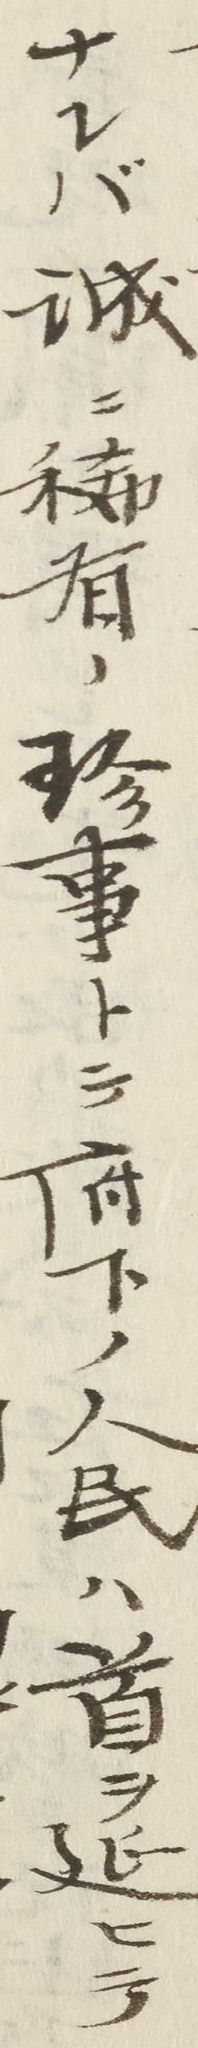ナレバ誠二希有ノ珍事トテ府下ノ人民ハ首ヲ延ヒテ
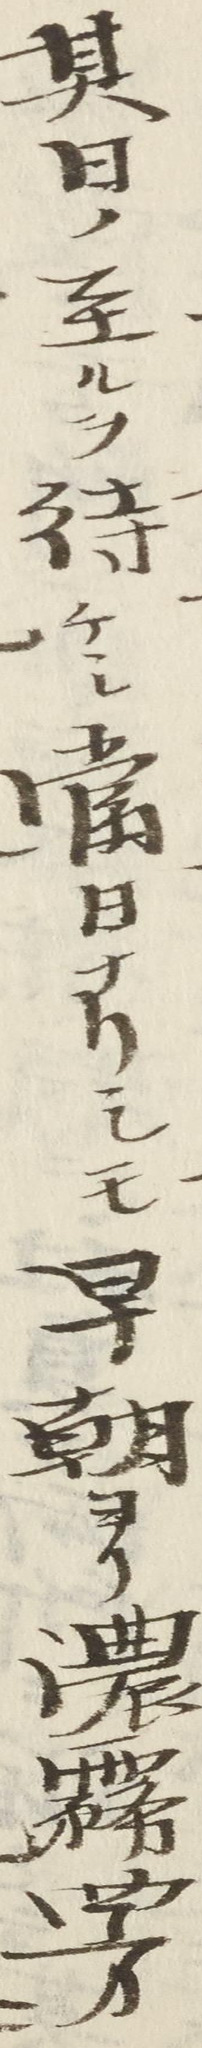其灯ノ至ルヲ待チシ当日ナリシモ早朝ヨリ濃霧四方
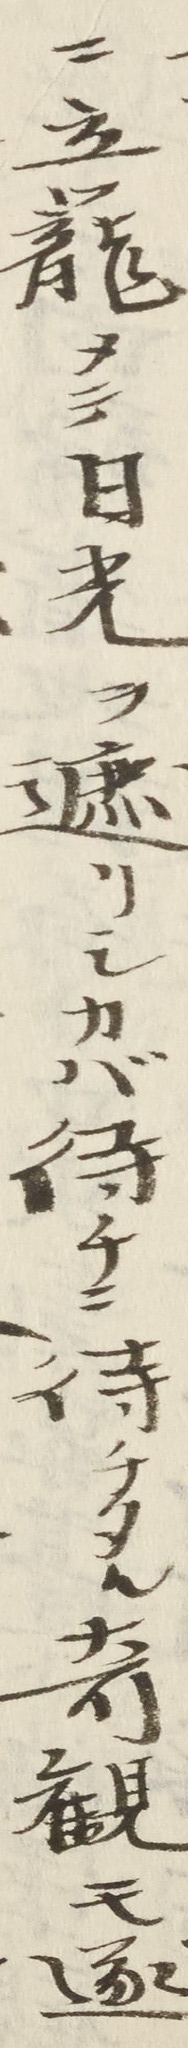ニ立籠メテ日光ヲ遮リシカバ待チニ待チタル奇観モ遂
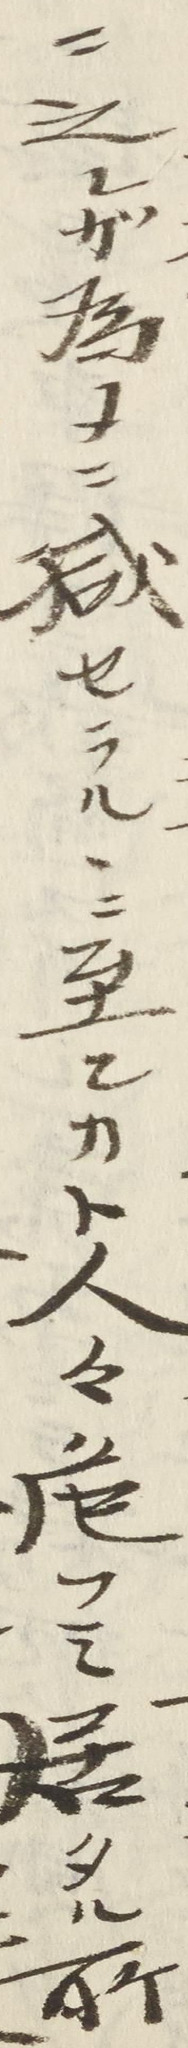ニ之レガ為メニ減セラルゝニ至ルカト人々危フミ居タル所
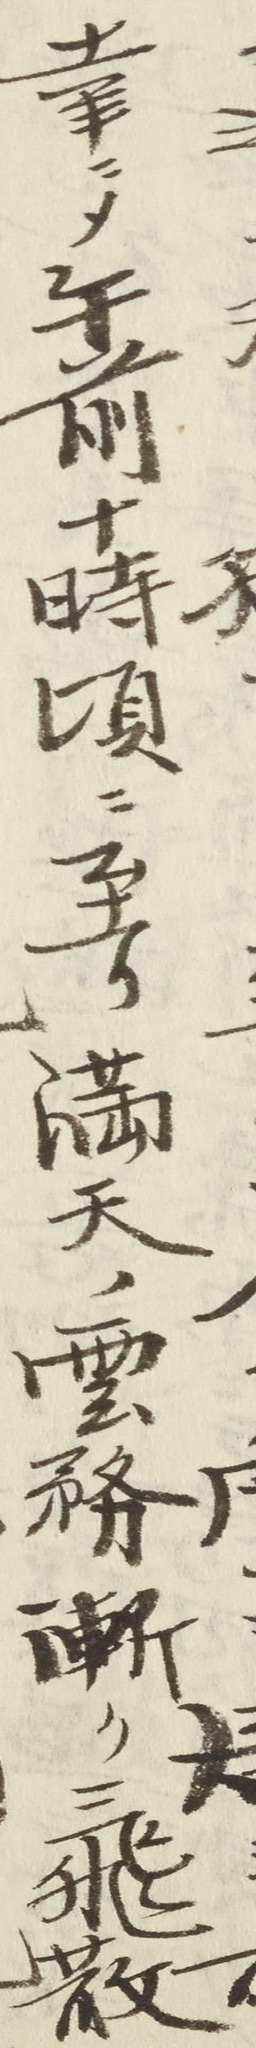幸ニシテ午前十時頃ニ至リ満天ノ雲務漸クニ飛散
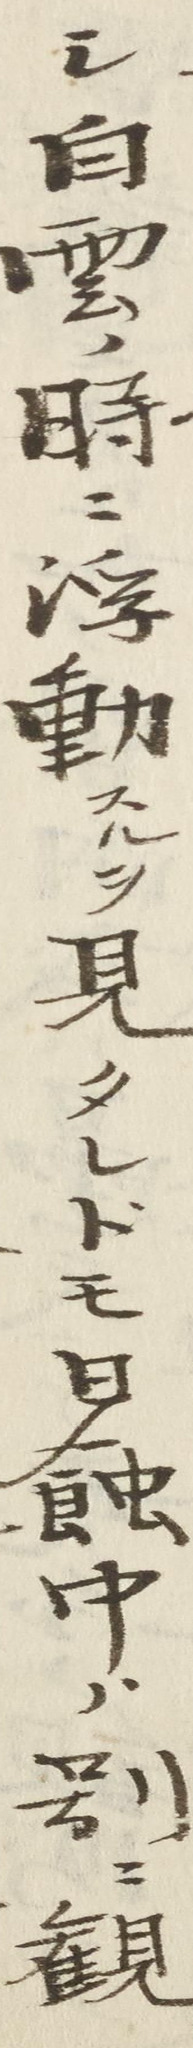シ白雲ノ時二浮動スルヲ見タレドモ日蝕中ハ別ニ観
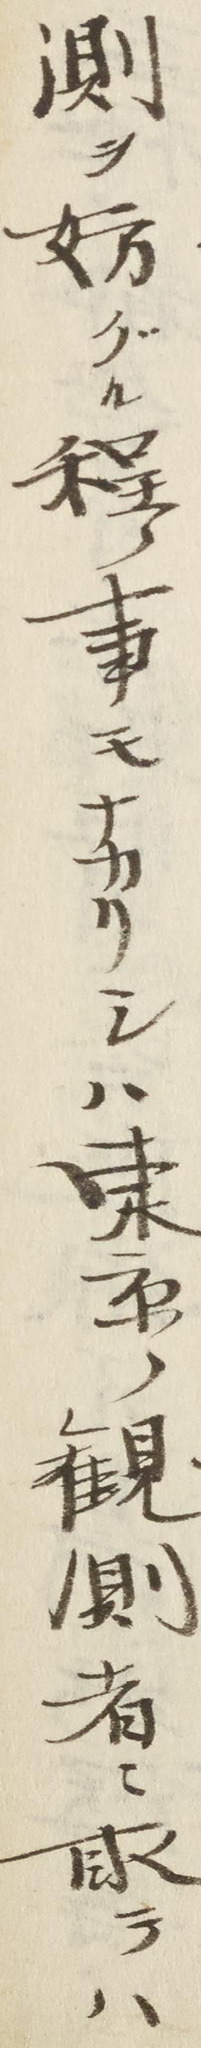測ヲ妨グル程ノ事モナカリシハ東京ノ観測者ニ取テハ

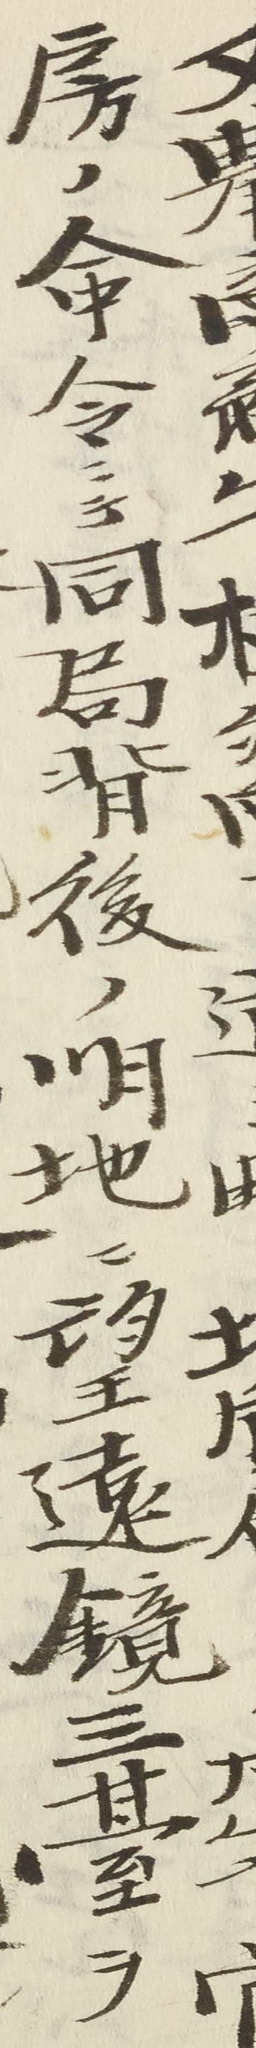房ノ命令ニテ同局背後ノ明地ニ望遠鏡三台ヲ

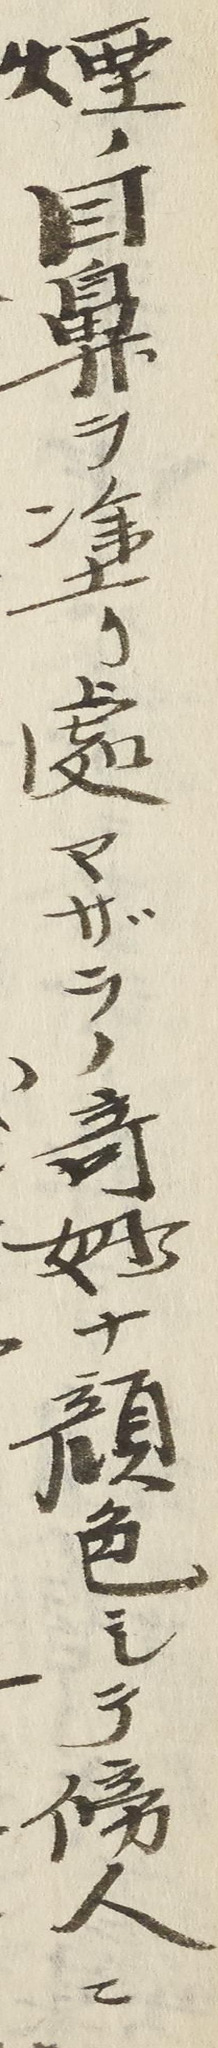煙ノ目鼻ヲ塗リ處マザラノ奇妙ナ顔色シテ傍人二
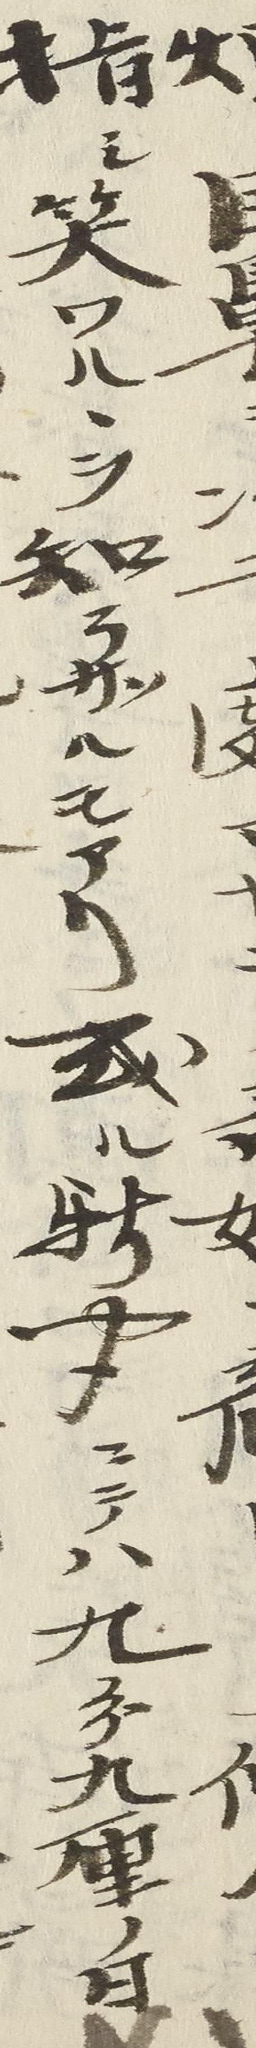指シ笑ワルゝヲ知ラザルモアリ或ル新聞ニテハ九分九厘ノ
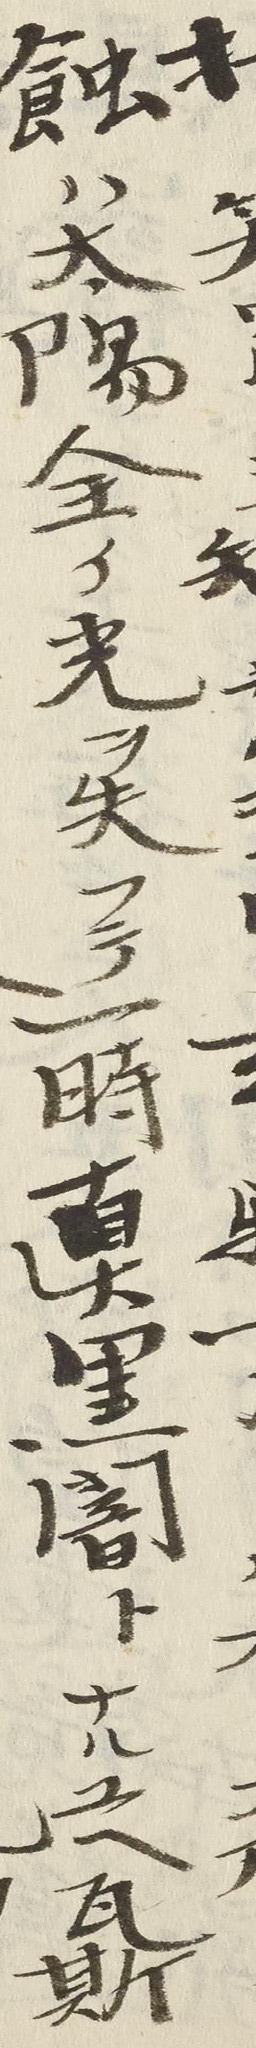日蝕ハ太陽全ク光ヲ失フテ一時真黒闇トナルユヘ瓦斯
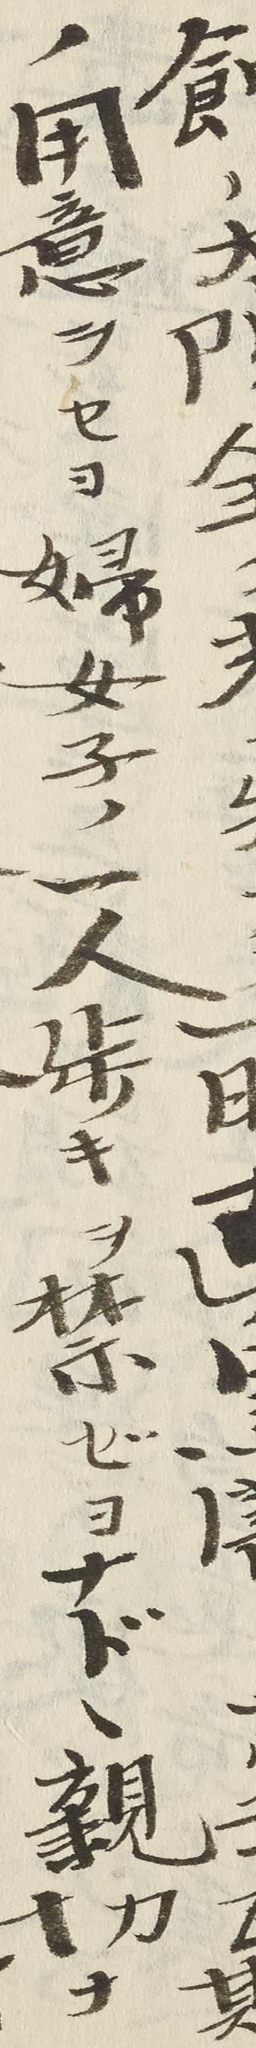ノ用意ヲセヨ婦女子ノ一人歩キヲ禁ゼヨナドヽ親切ナ
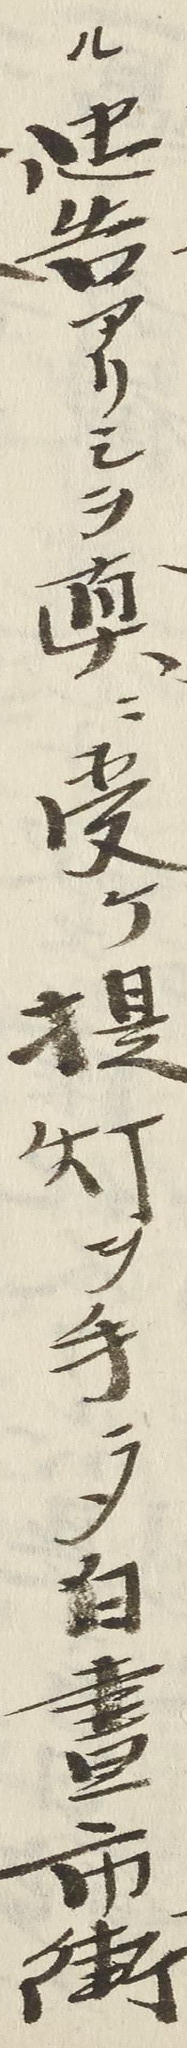ル忠告アリシヲ真二受ケ提灯ヲ手ニシテ白昼市街
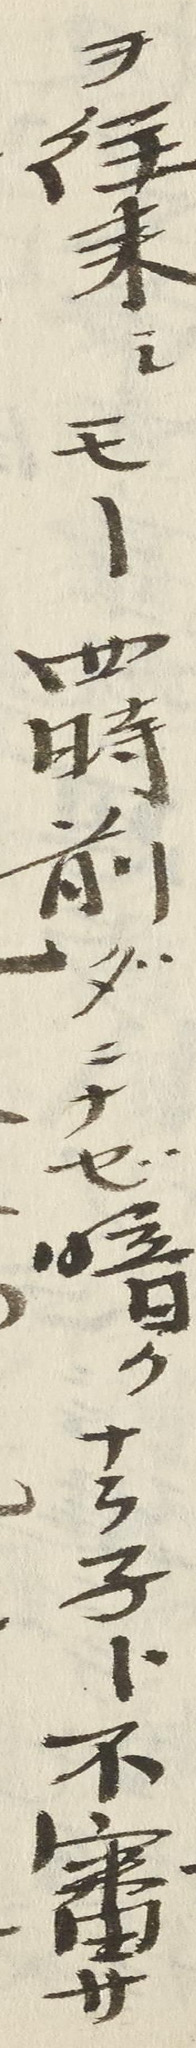ヲ往来シモー四時前ダニナゼ暗クナラネト不審サ
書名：日蝕録　全
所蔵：東京大学地震研究所図書室 Earthquake Research Institute Library, The University of Tokyo, JAPAN
